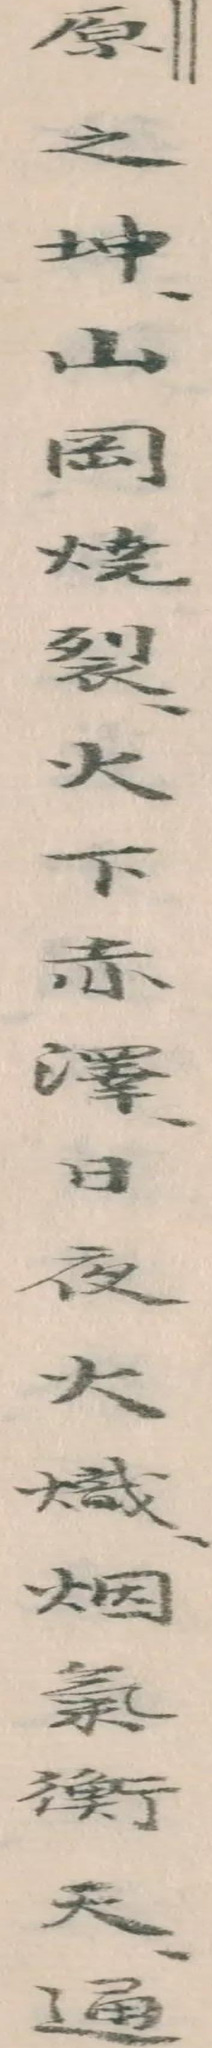原之坤、山岡焼裂、火下赤沢、日夜火熾、烟気衡天、通
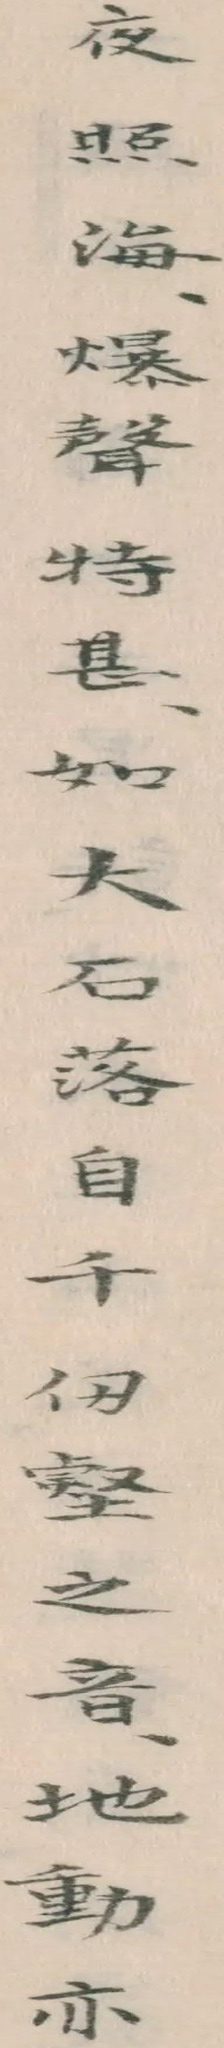夜照海、爆声特甚、如大石落自千仭壑之音、地動亦
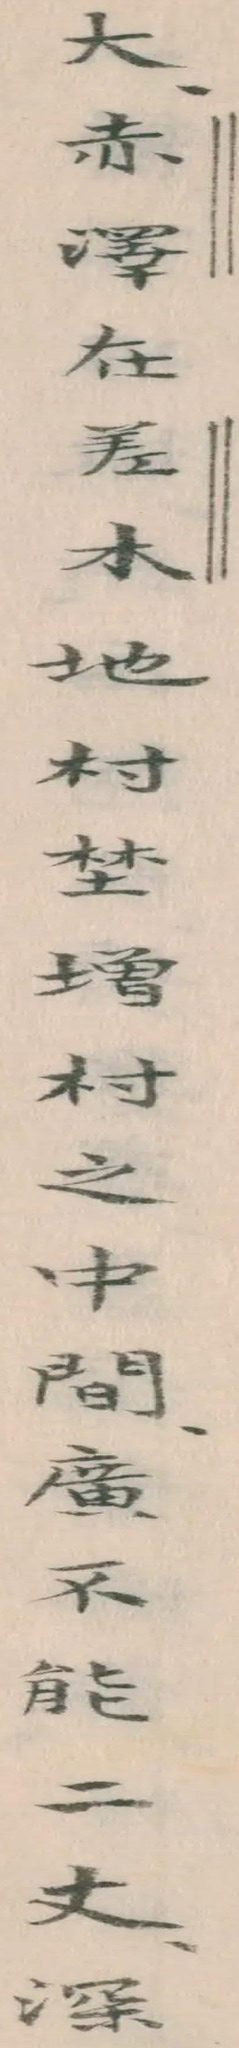大、赤沢在差木地村埜増村之中間、広不能二丈、深
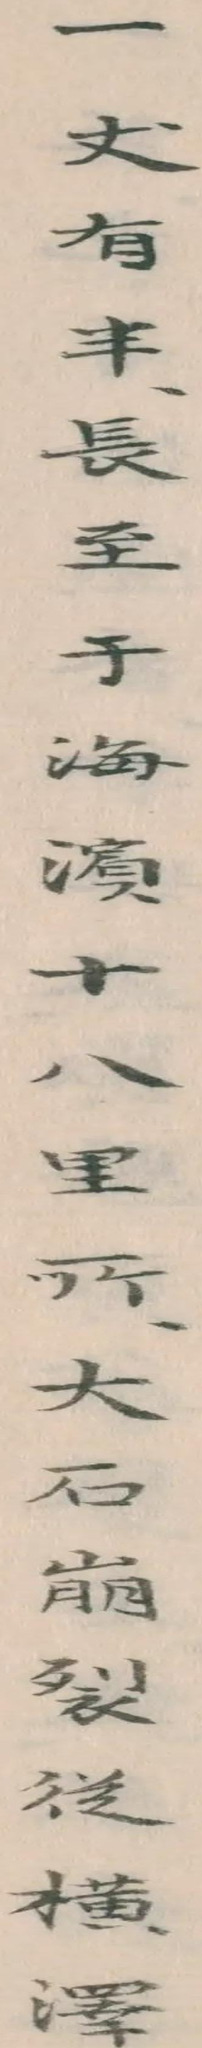一丈有半、長至于海浜十八里所、大石崩裂従横沢
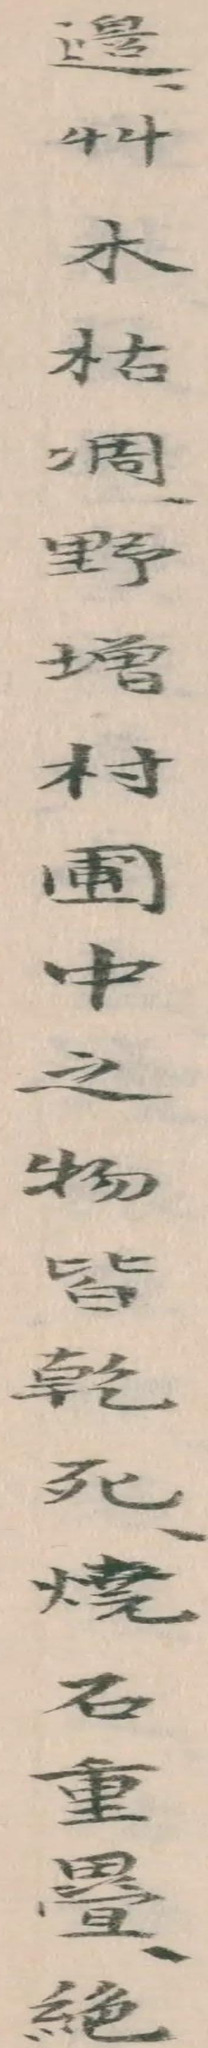辺、艸木枯凋、野増村圃中之物皆乾死、焼石重畳、絶
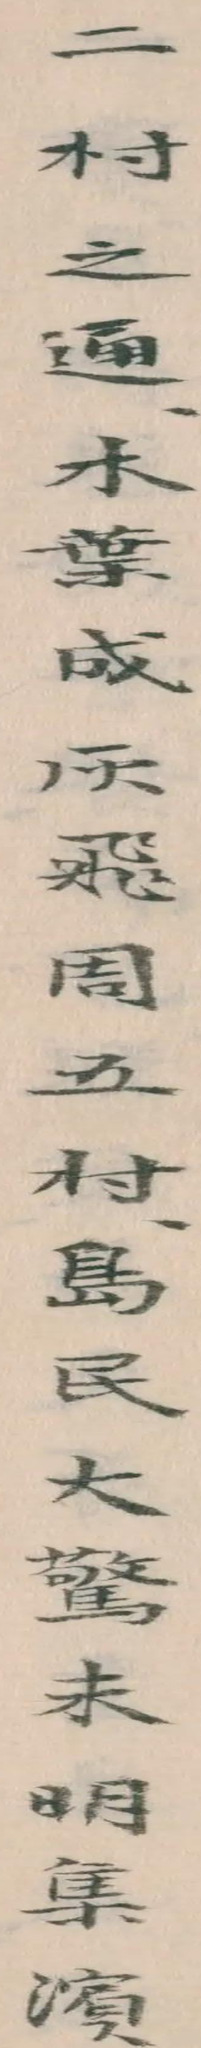二村之通、木葉成灰飛周五村、島民大驚未明集浜
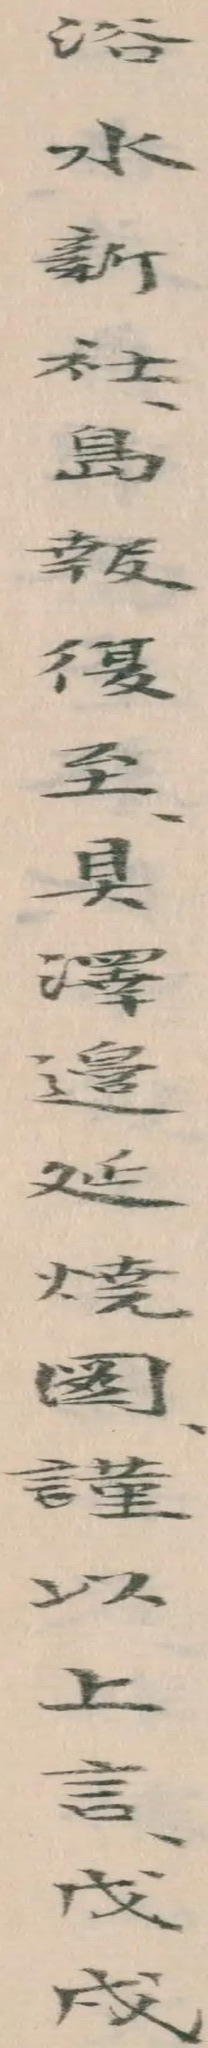浴水新社、島報復至、具沢辺延焼図、謹以上言、戊戌
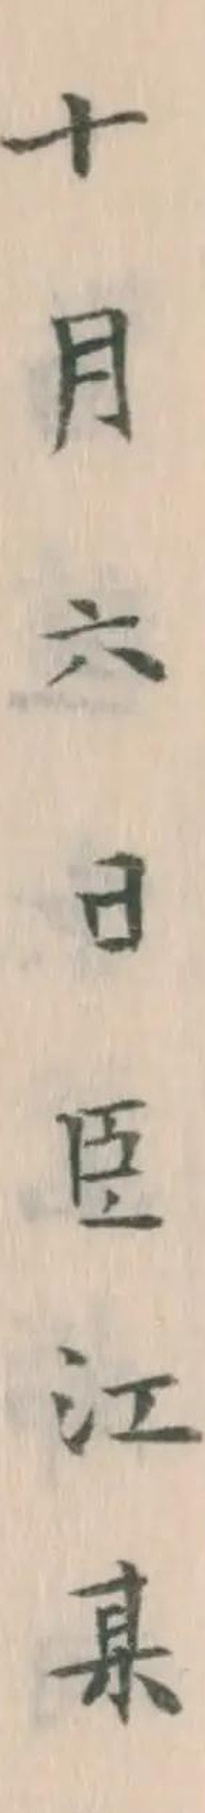十月六日臣江某
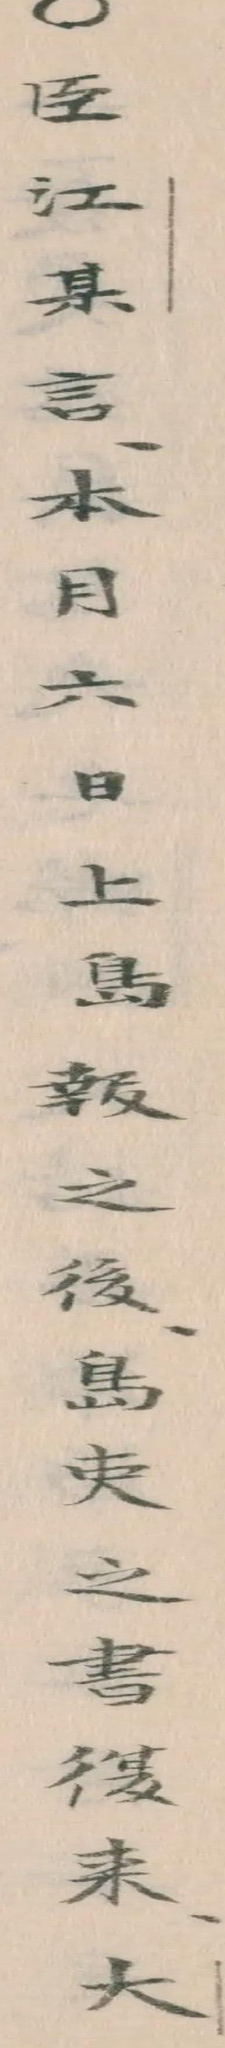○臣江某言、本月六日上島報之後、島吏之書復来、大
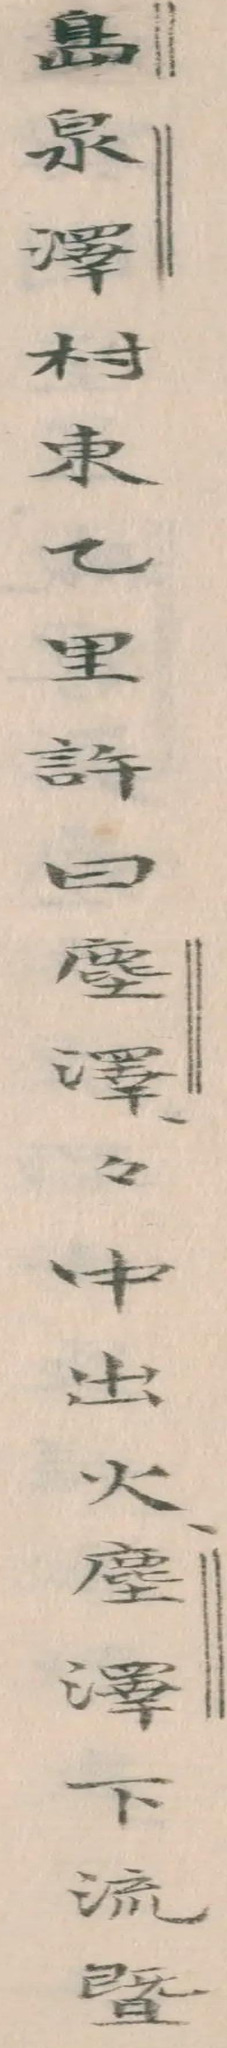島泉沢村東乙里許曰塵沢、々中出火、塵沢下流曁
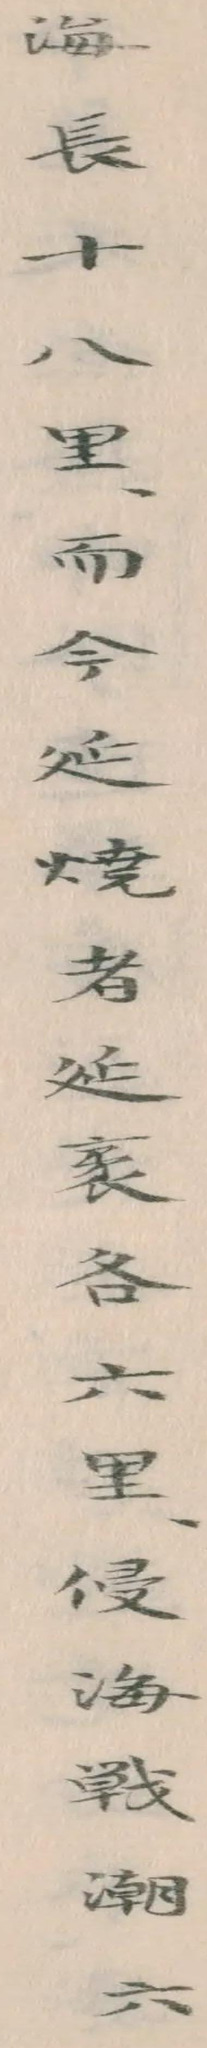海長十八里、而今延焼者延袤各六里、侵海戦潮六
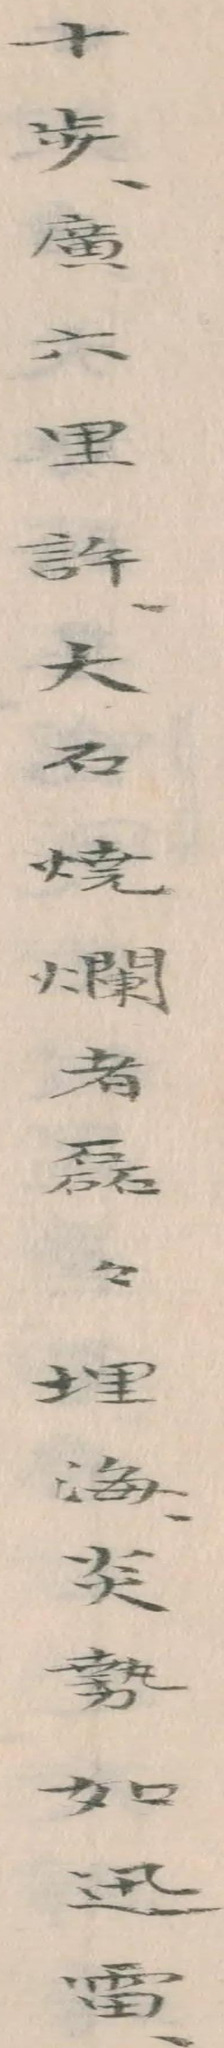十歩、広六里許、大石焼爛者磊々埋海、炎勢如迅雷、
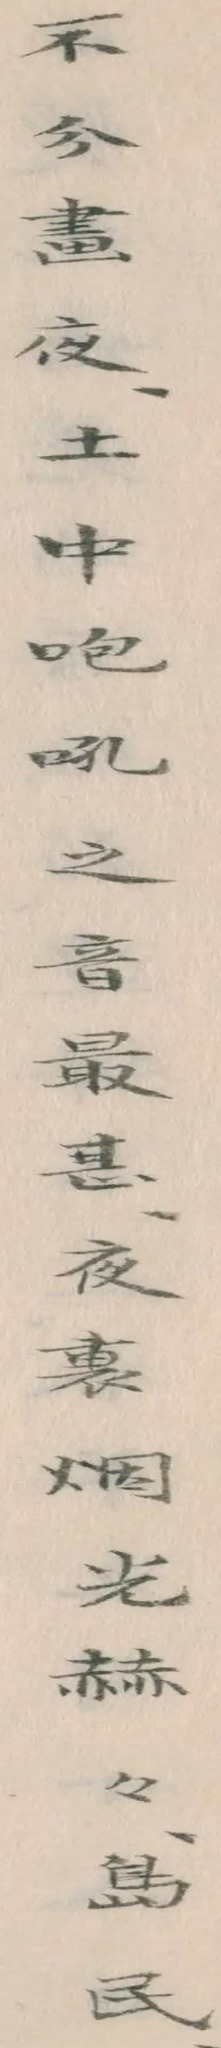不分画夜、土中咆吼之音最甚、夜裏烟光赫々、島民、
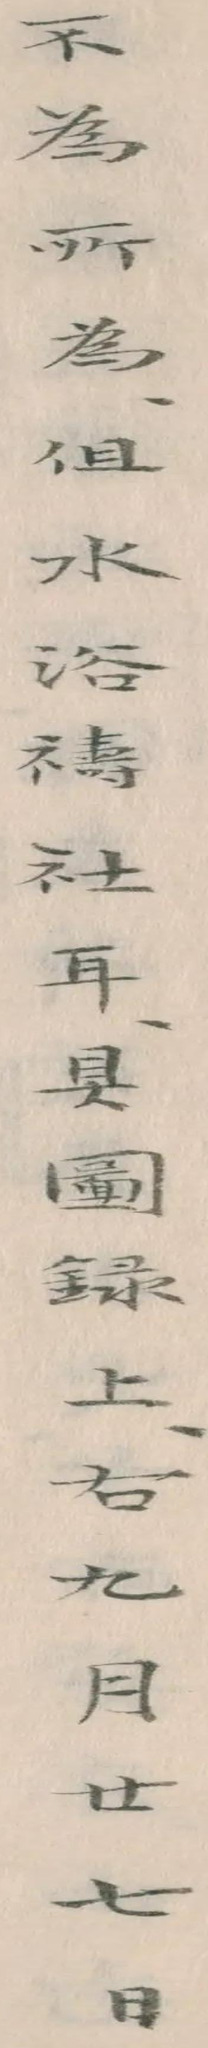不為所為、但水浴祷社耳、具図録上、右九月廿七日
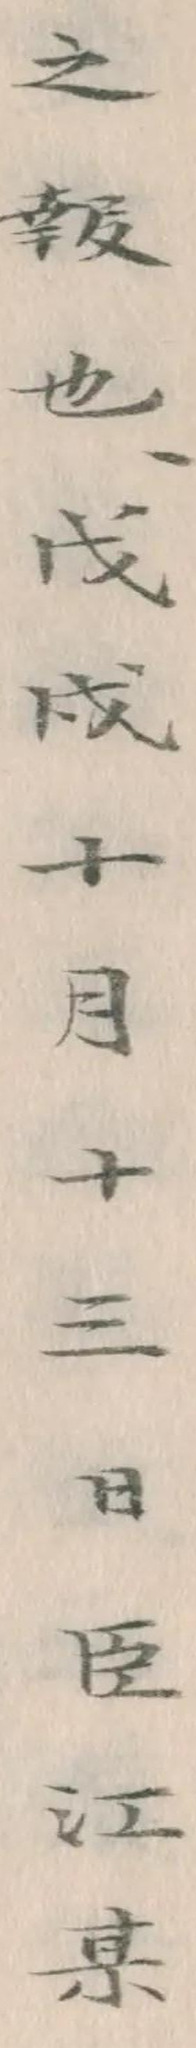之報也、戊戌十月十三日臣江某
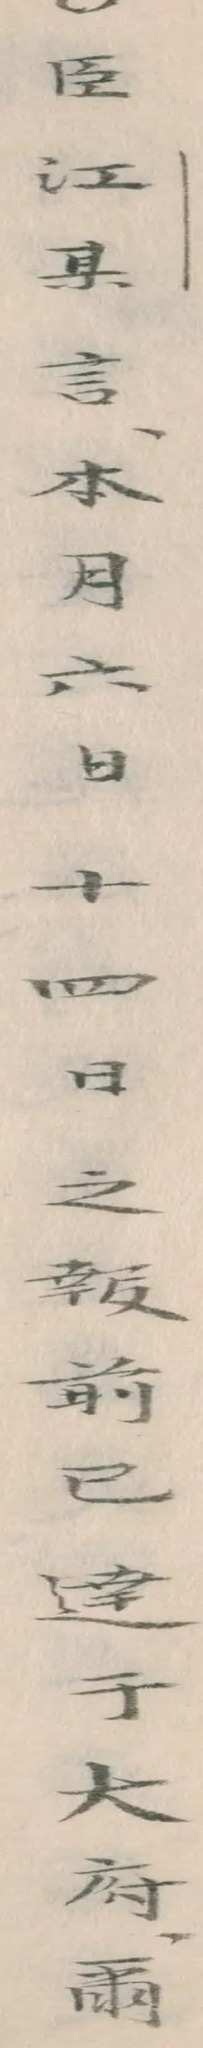○臣江某言、本月六日十四日之報前已達于大府、爾
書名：地災撮要. 巻11-12(地震之部)
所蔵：国立国会図書館 National Diet Library, JAPAN
